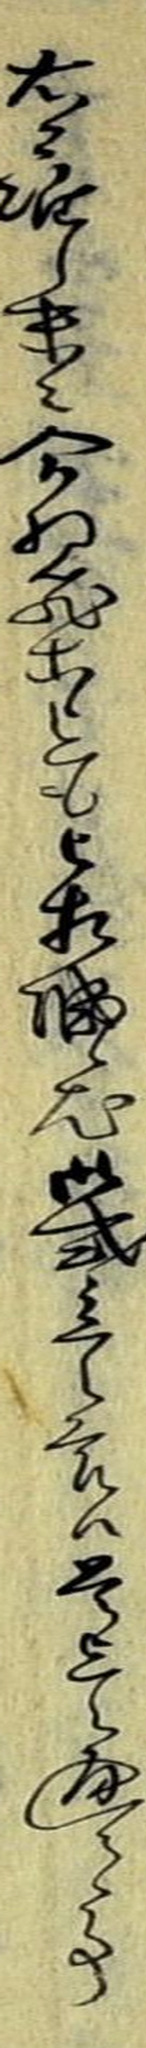右に准し末々合羽蔵等迄も被相減候尤御式立之節は是迄之通に候事
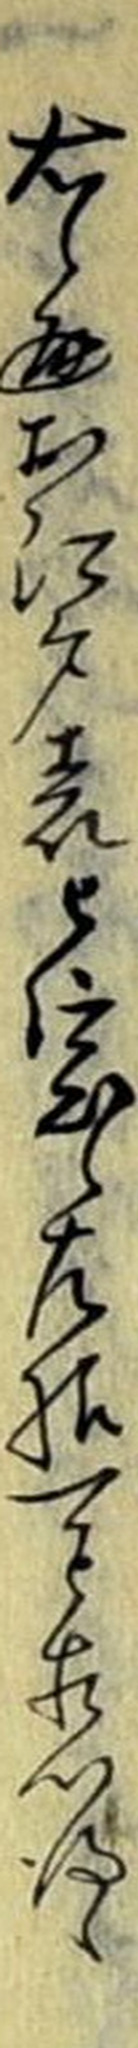右之通於江戸表被仰出候左様可被相心得候
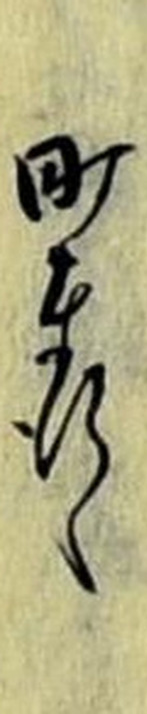町奉行へ
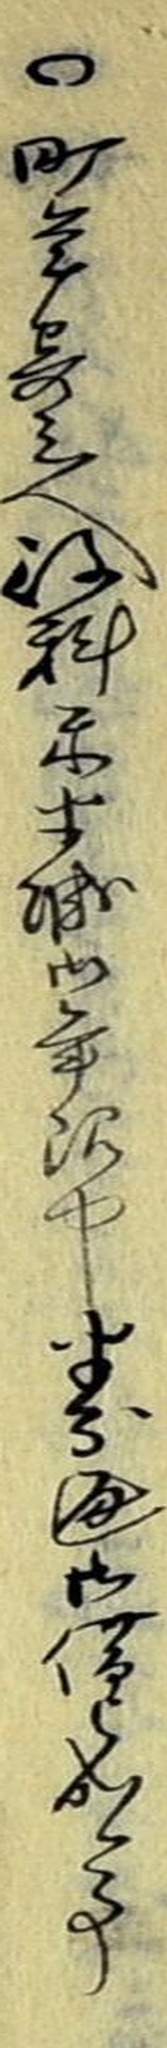○町年寄三人役料米半減御年限中半分通御借被成候事
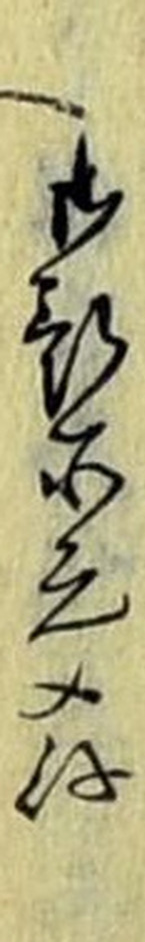御預所元〆役
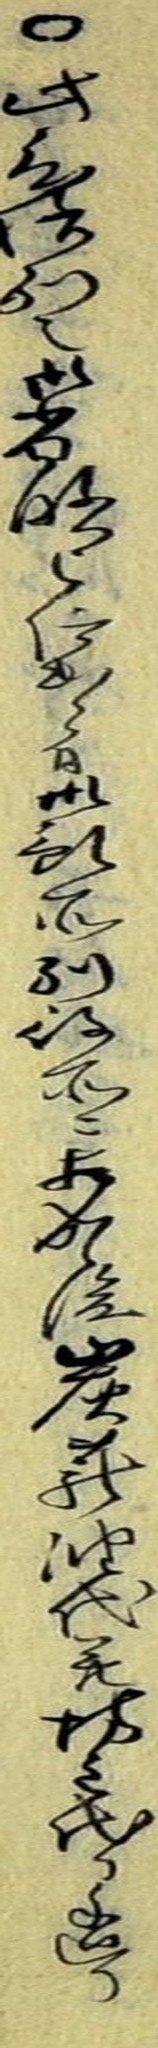○此度格別之御省略被仰出候に付御預所別役所に相成後炭薪油代并坊主代り手廻り
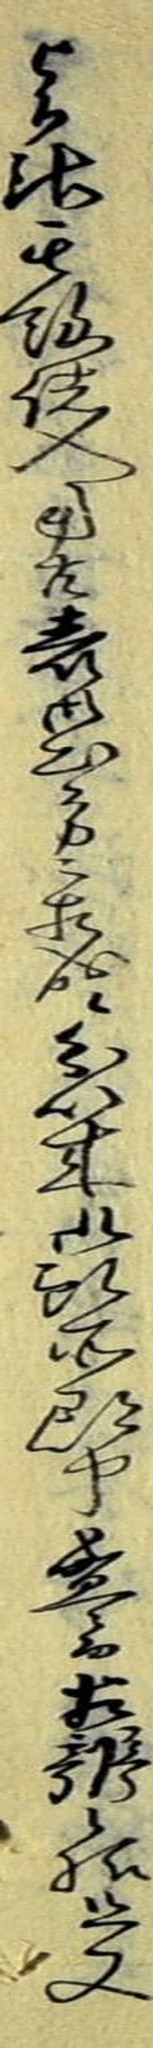被下銀其餘諸入用共表御出方に相成候分以來御預所郡中盛に而相弁候様且又

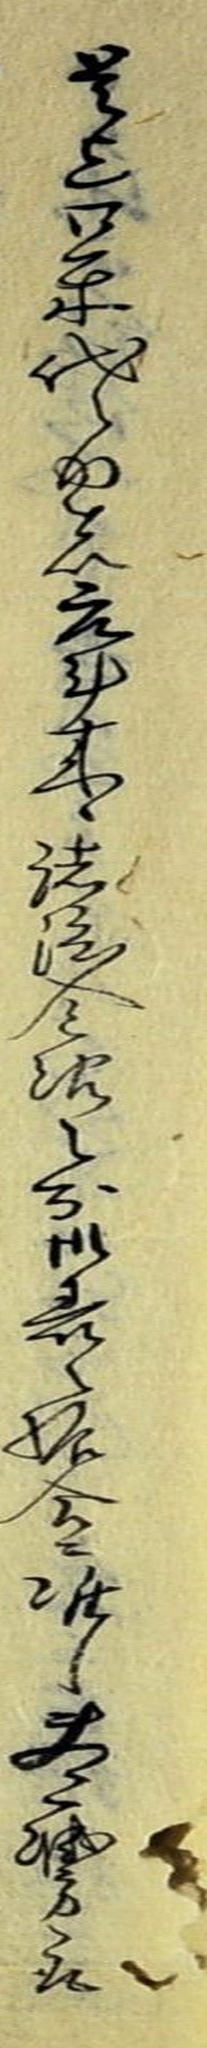是迄口米代之内を以取斗来候諸渡金銀之分御表之振合に准し夫々減方へ取
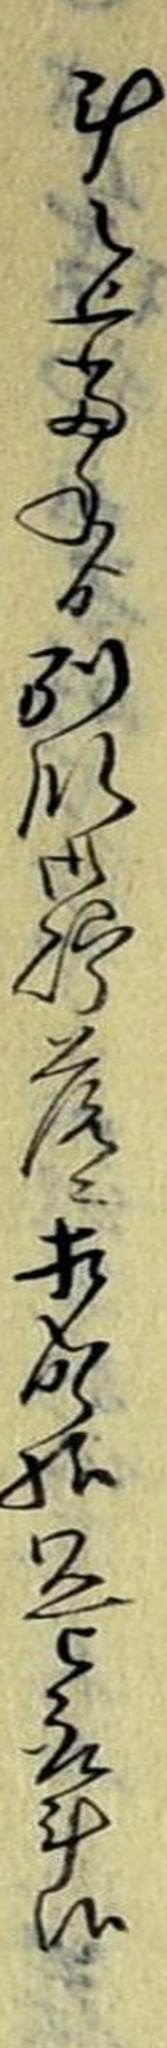斗之上当年ゟ別段御貯落に相成候様宜被取斗候
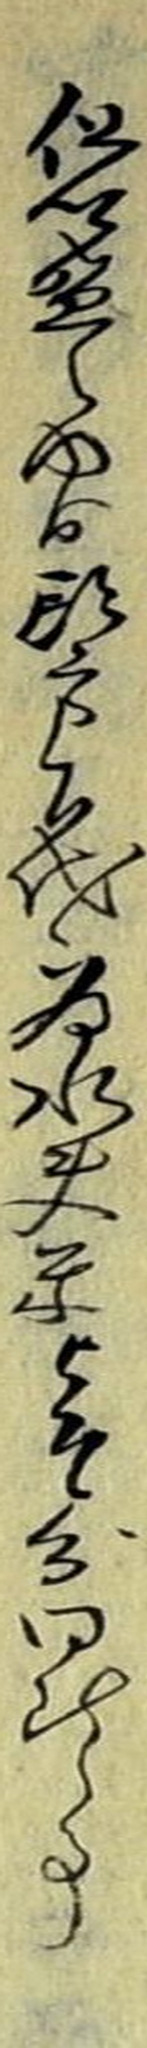但郷盛之内ゟ郡方下代へ為水夫米被下候分同断之事
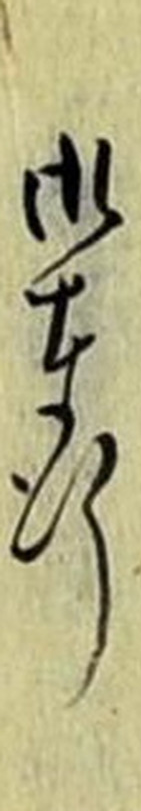御奉行
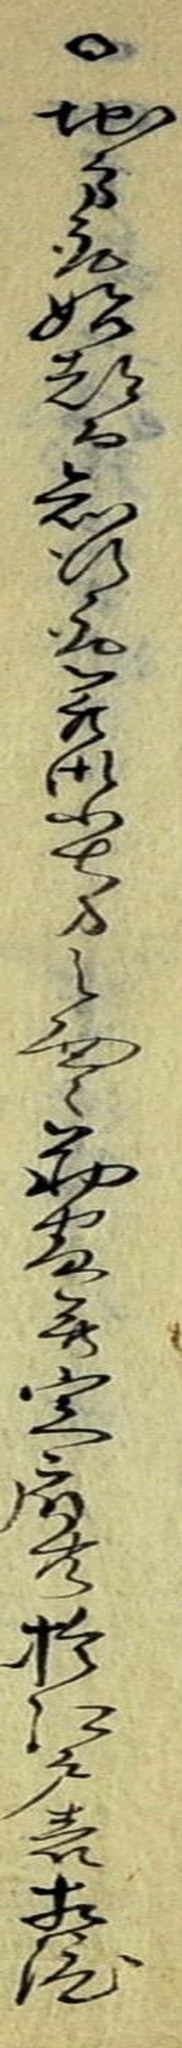○地方取始都而知行取并御ふち方之面々勤番并定府共於江戸表相渡
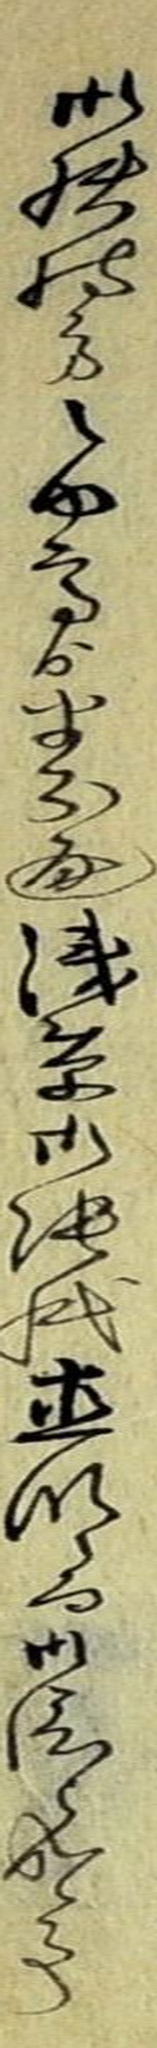御扶持方之内高ゟ半分通浅草御張紙直段に而御渡被成候事
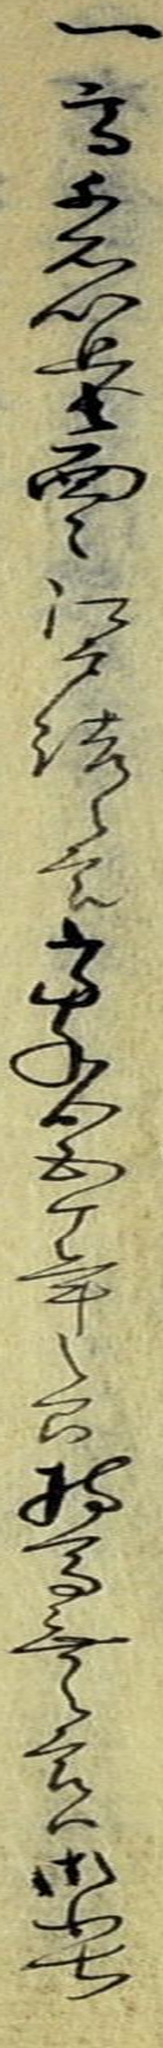一高千石以上之面々江戸詰之節当年ゟ五ヶ年之間持高無之節は御ふち
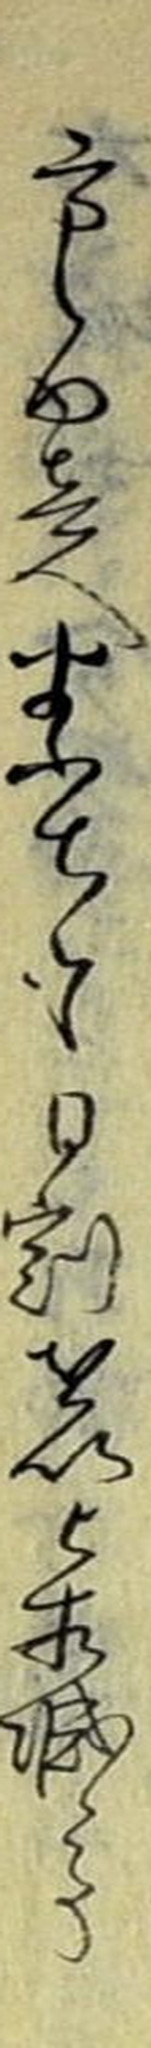方之内壱人半ふちつヽ日割を以被相減候事
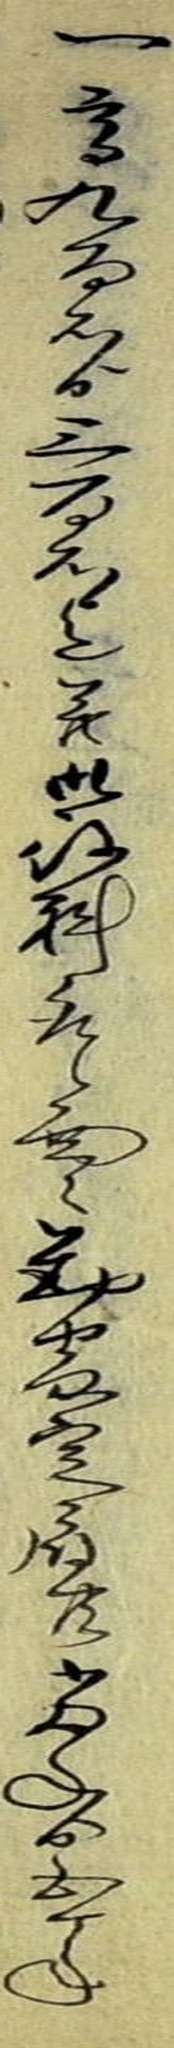一高九百石ゟ三百石迄并御役料取之面々勤番定府共当年ゟ五ヶ年
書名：命令之部 六
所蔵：福井県文書館 Fukui Prefectural Archives
